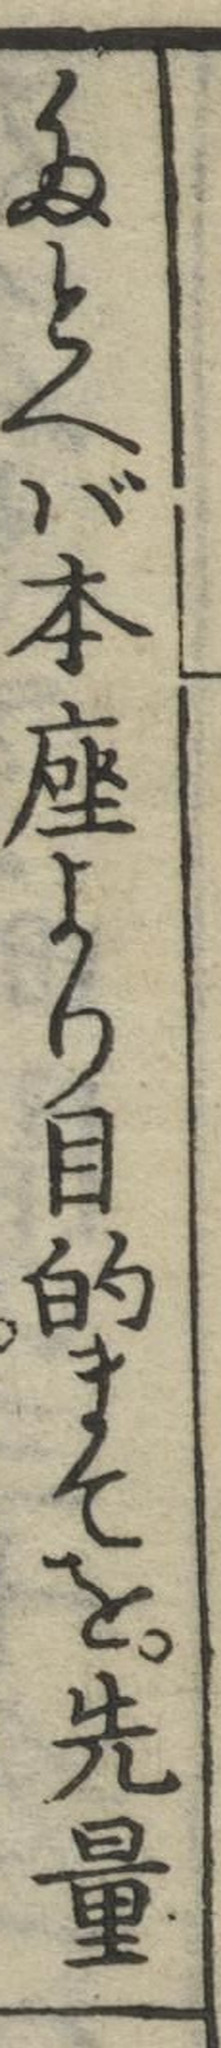たとへば本座より目的まてを。先量
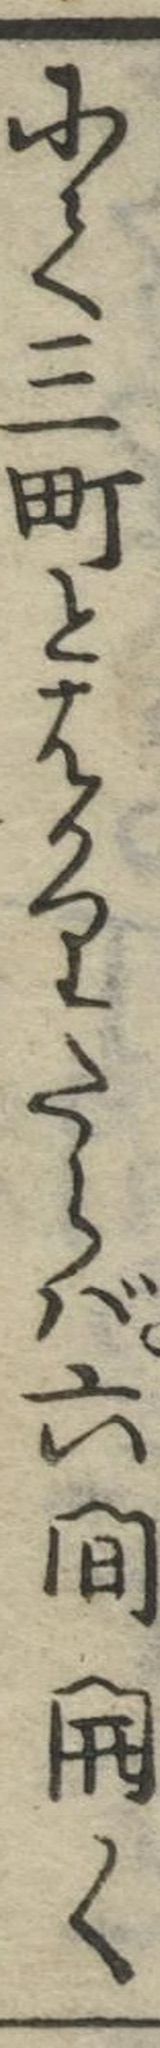にく三町とはかりたらば。六間開く
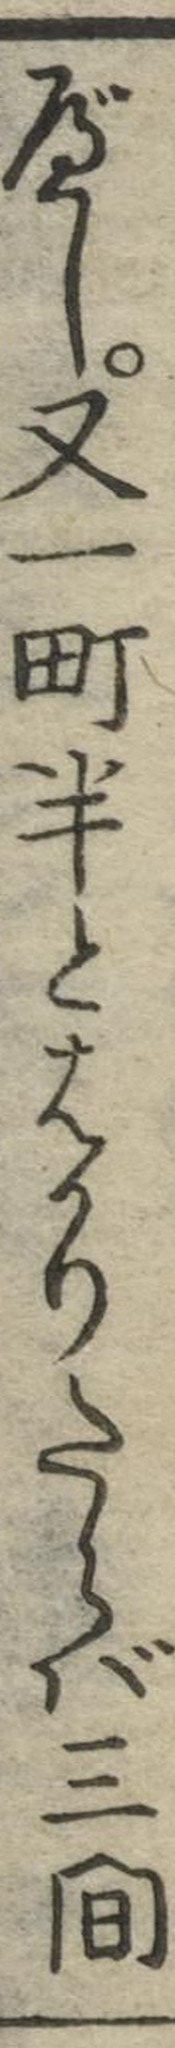べし。又一町半とはかりたらば三間
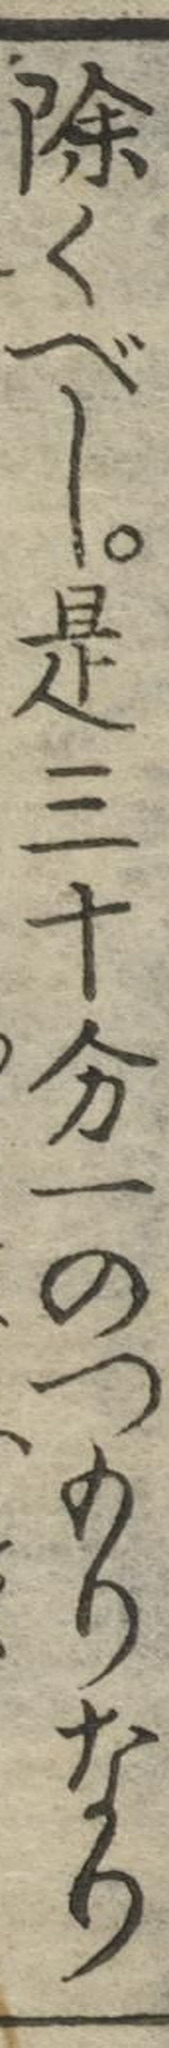除くべし。是三十分一のつのりなり
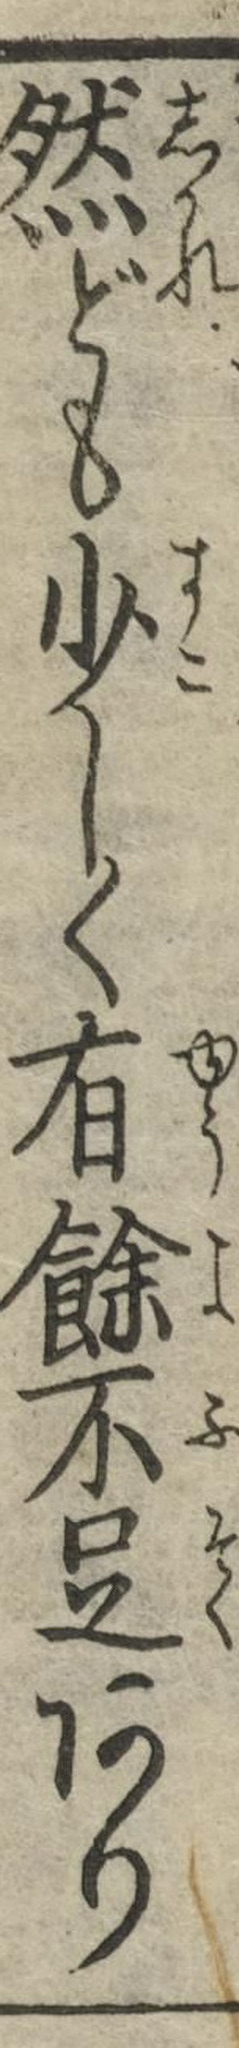然ども少しく有餘不足なり
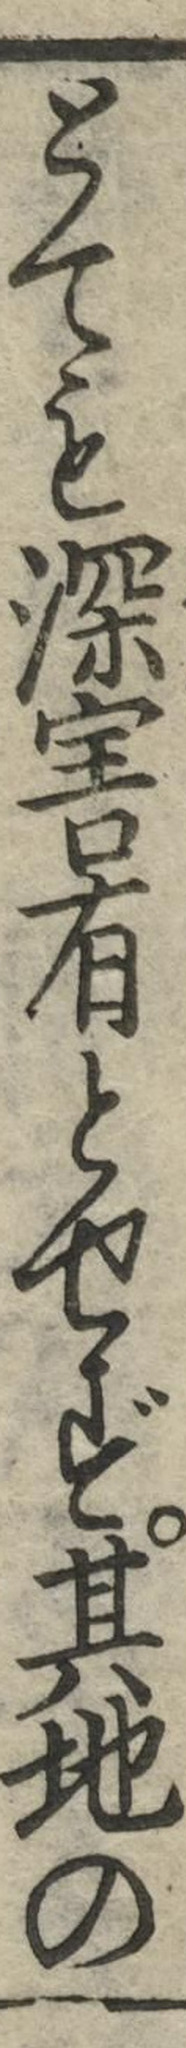とても深害有とせず。其地の
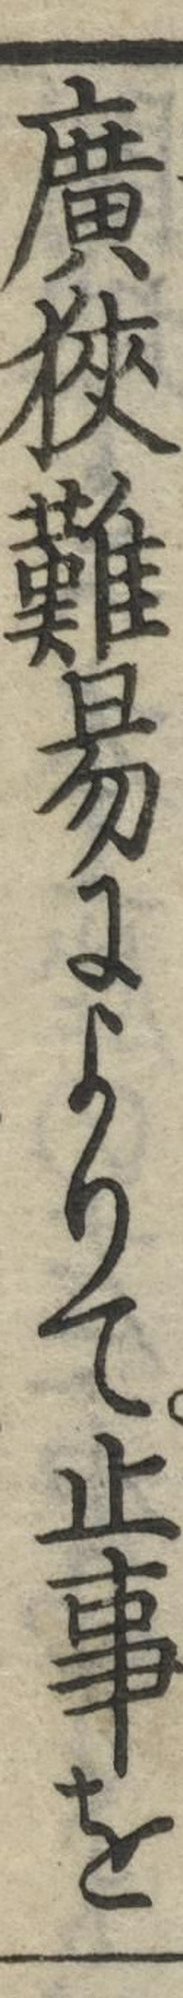廣狭難易によりて。止事を
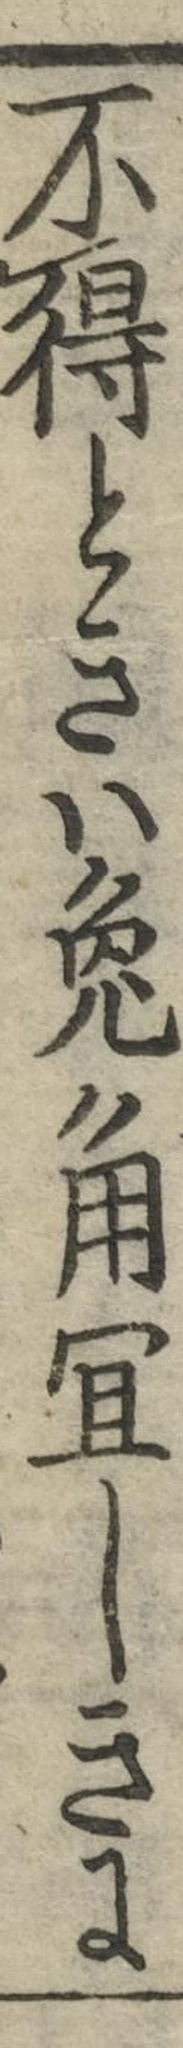不得ときは兎角宜しきに
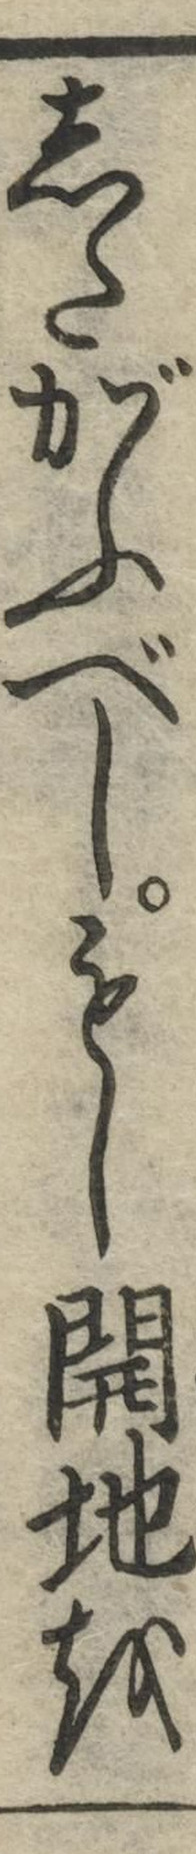したがふべし。もし開地を
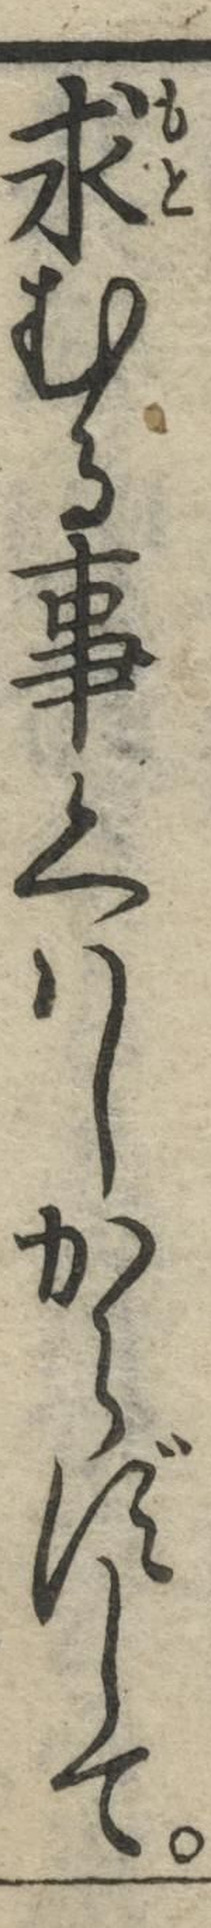求むる事くりかえずして。
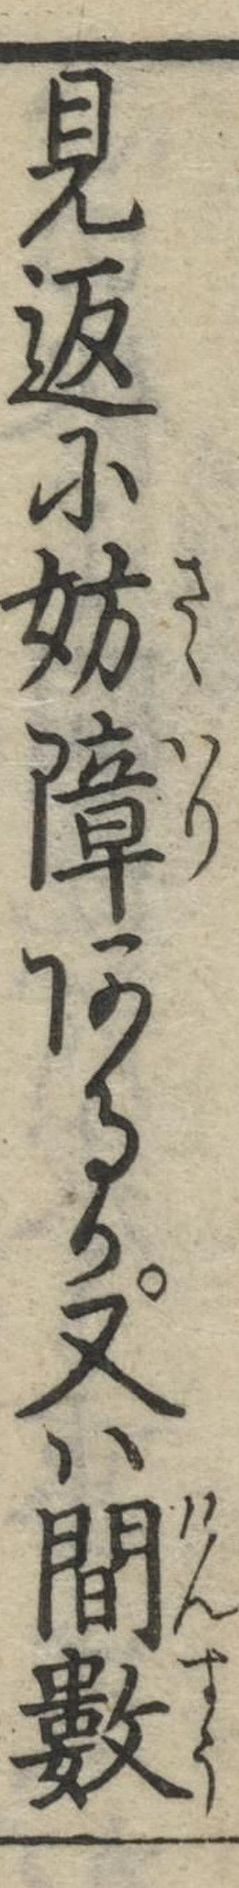見返に妨障あるか。又は間数
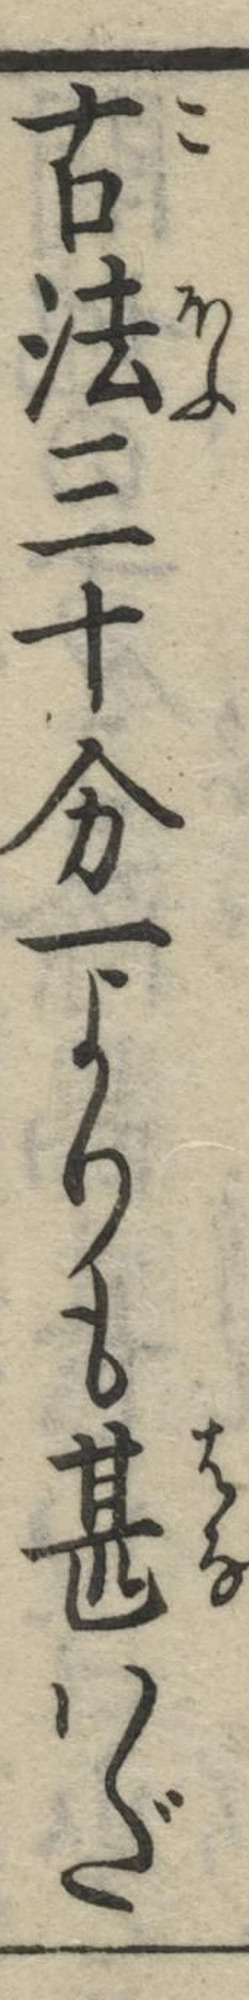古法三十分一よりも甚はだ
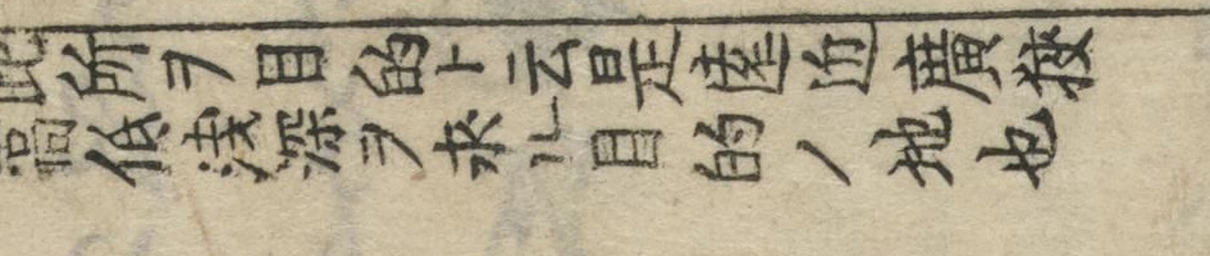高低浅深ヲ来ル目的ノ地也
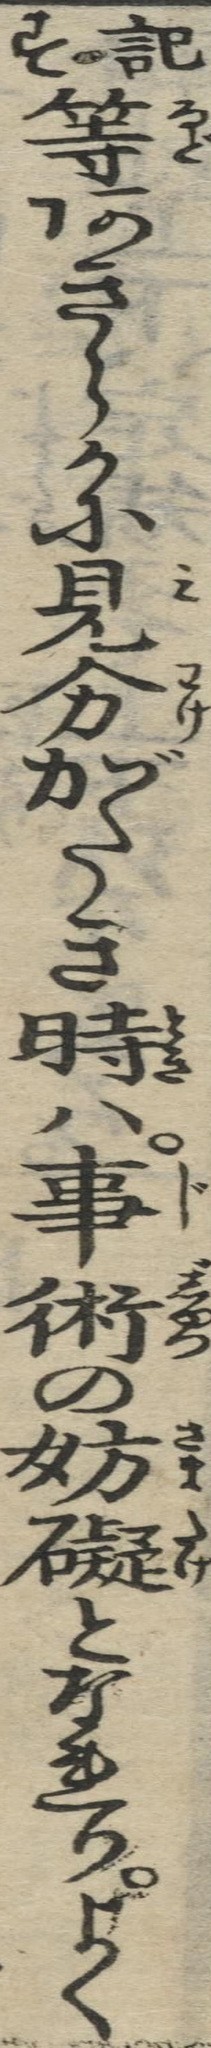記す等あきらかに見分がたき時は。事術の妨礙となけか。よく
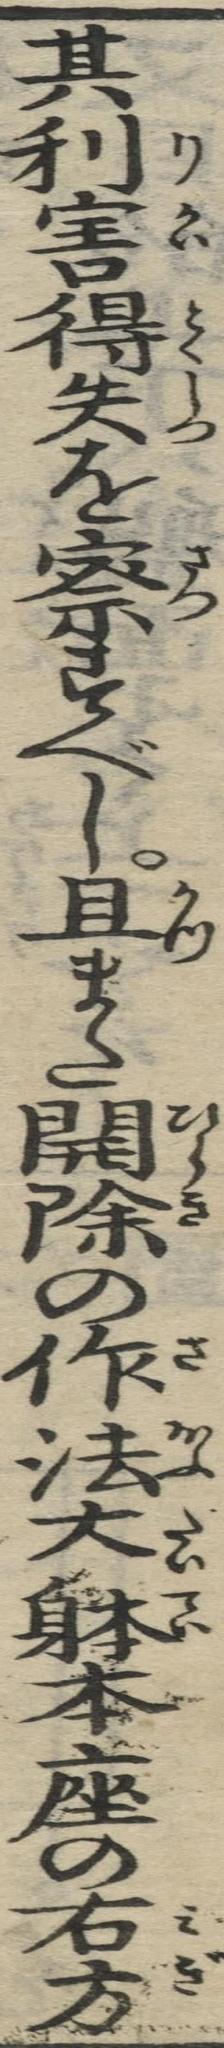其利害得失を察すべし。且また開除の作法大躰本座の右方
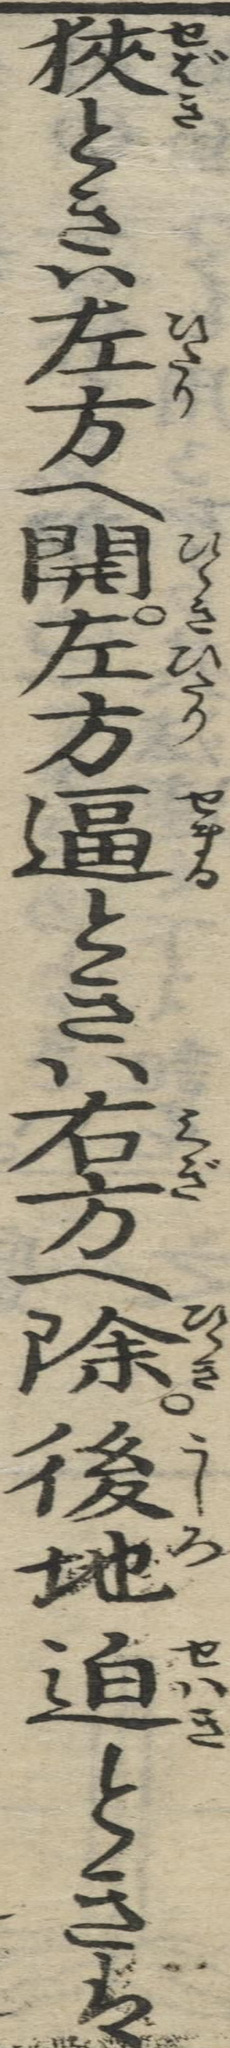狭ときは左方へ開。左方逼ときは右方へ除。後地迫ときは
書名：量地指南　巻之一（内題）
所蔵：東京大学地震研究所図書室 Earthquake Research Institute Library, The University of Tokyo, JAPAN
